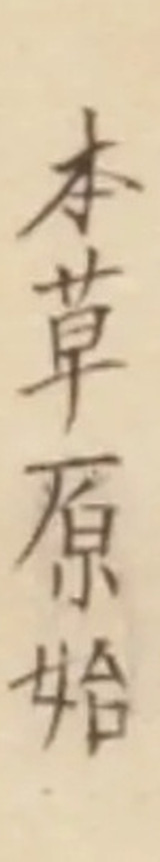本草原始
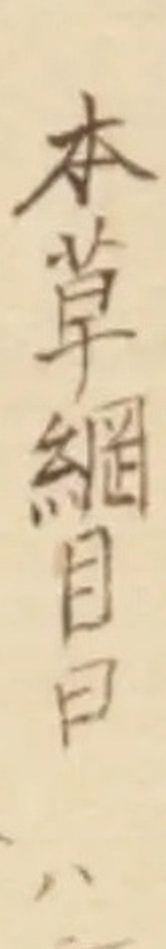本草綱目曰
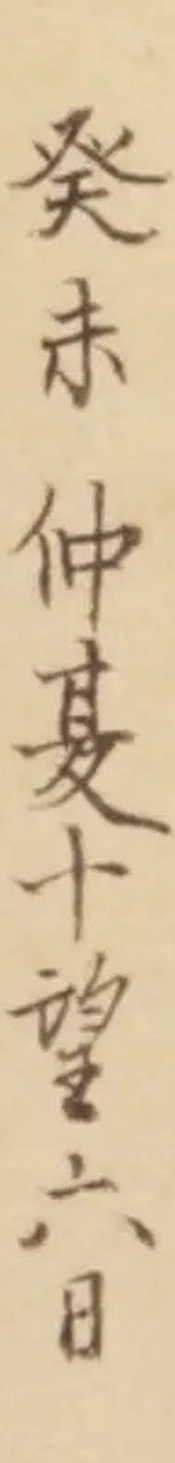癸未仲呂十望六日

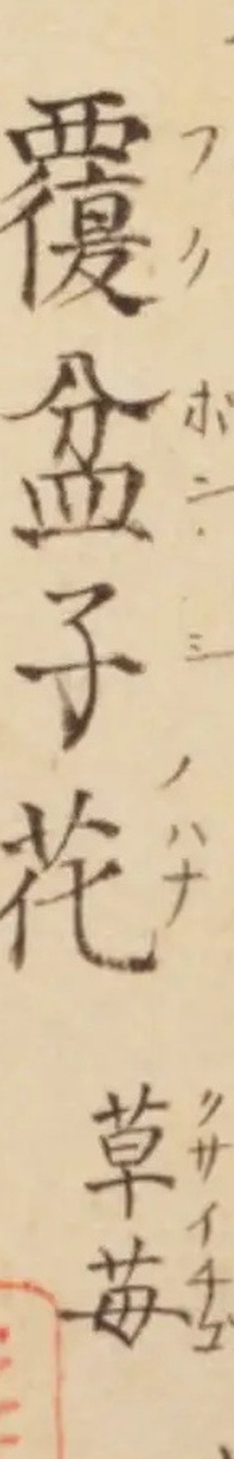覆盆子花草苺
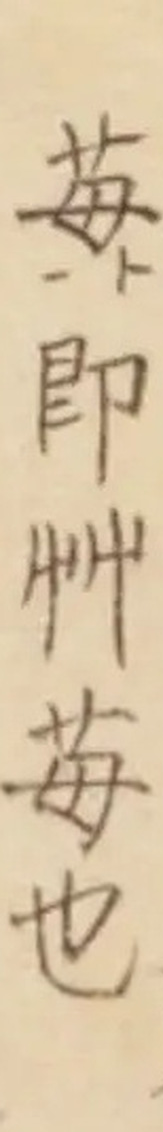苺ト即艸苺也
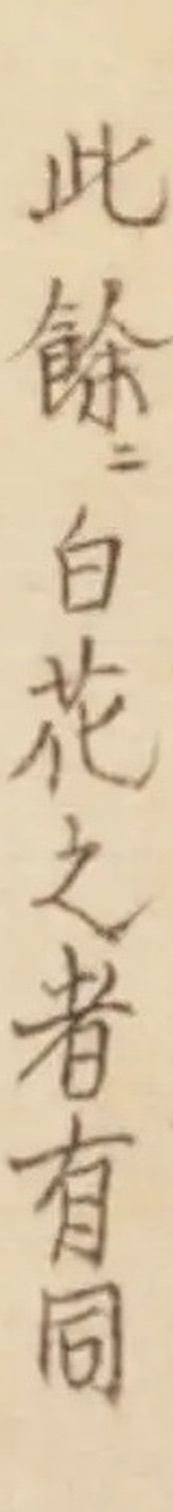此餘ニ白花之者有同
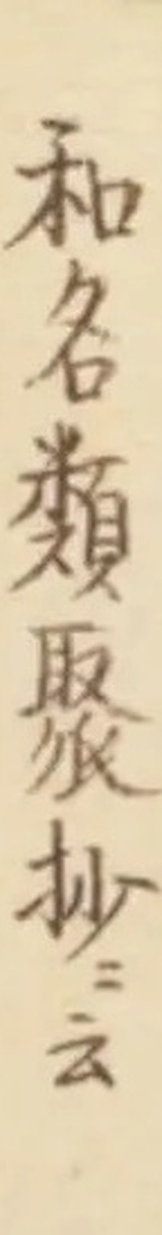和名類聚抄ニ云
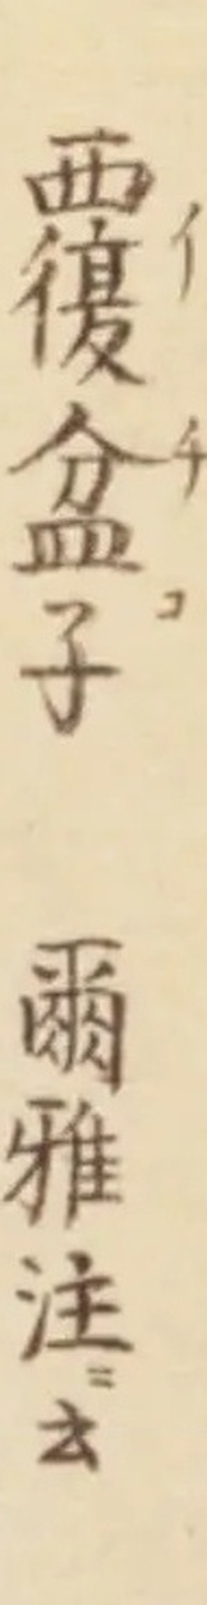覆盆子爾雅注ニ云
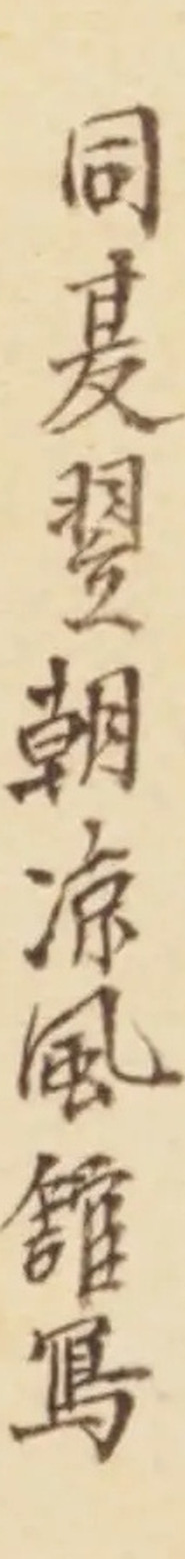同夏翌朝涼風舘寫
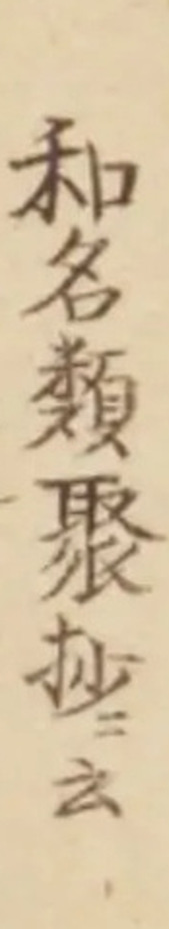和名類聚抄ニ云
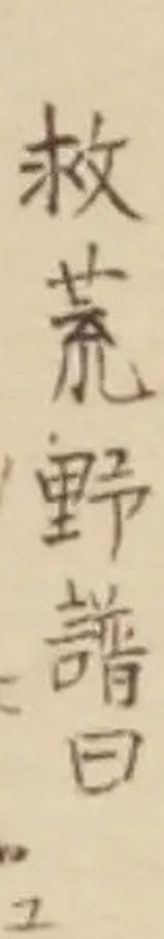救荒野譜曰
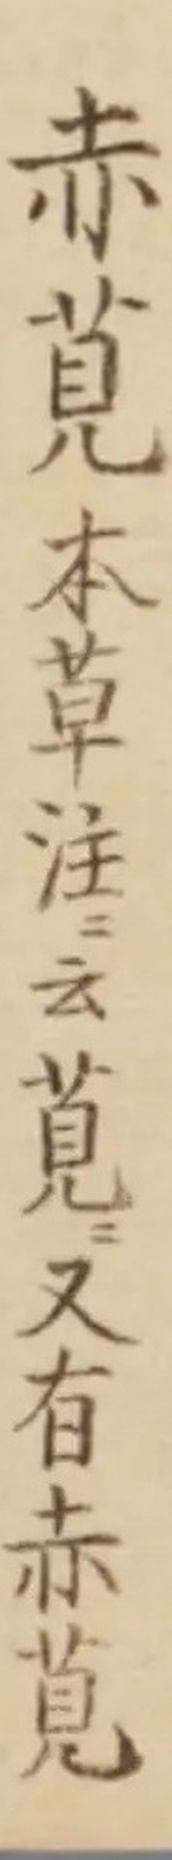赤莧本草注ニ云又有赤莧
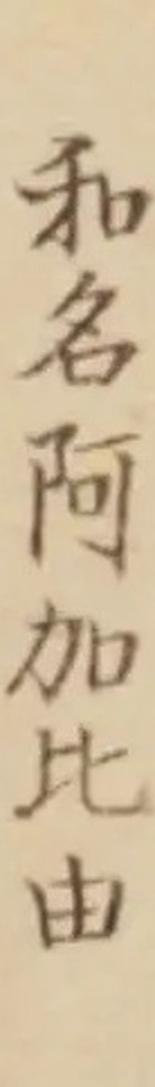和名阿加比由
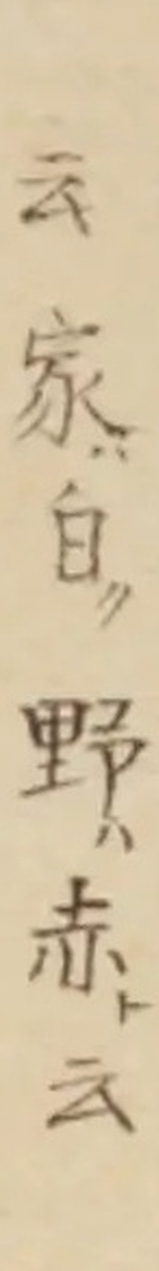云家ハ白ク野ハ赤ト云

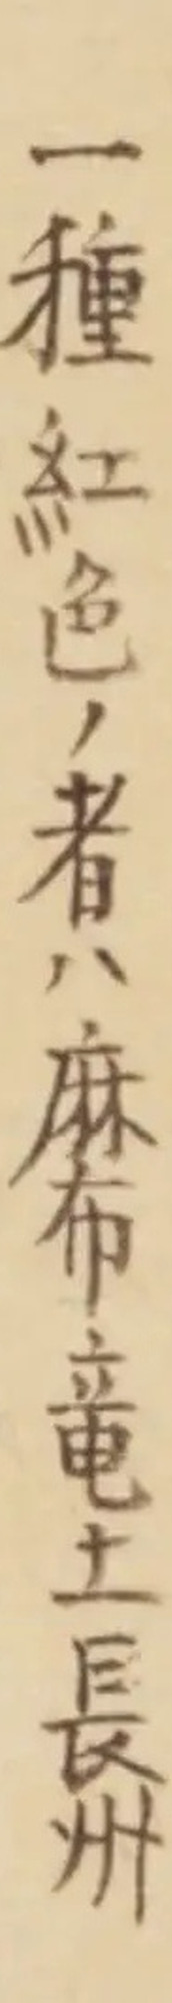歳時記一種紅色ノ者ハ麻布竜長州
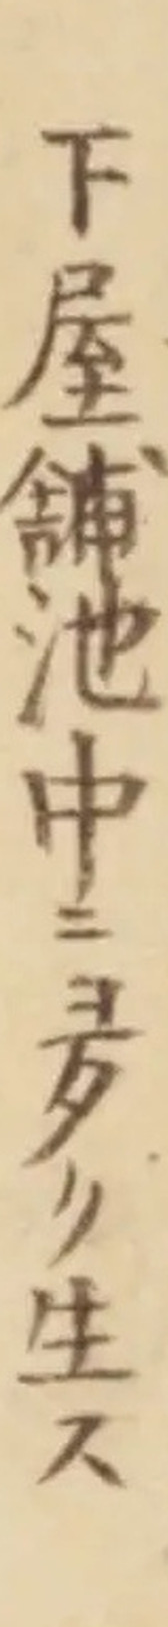下屋舗池中ニヨク生ス
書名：梅園草木花譜夏之部. 1
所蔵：国立国会図書館 National Diet Library, JAPAN
